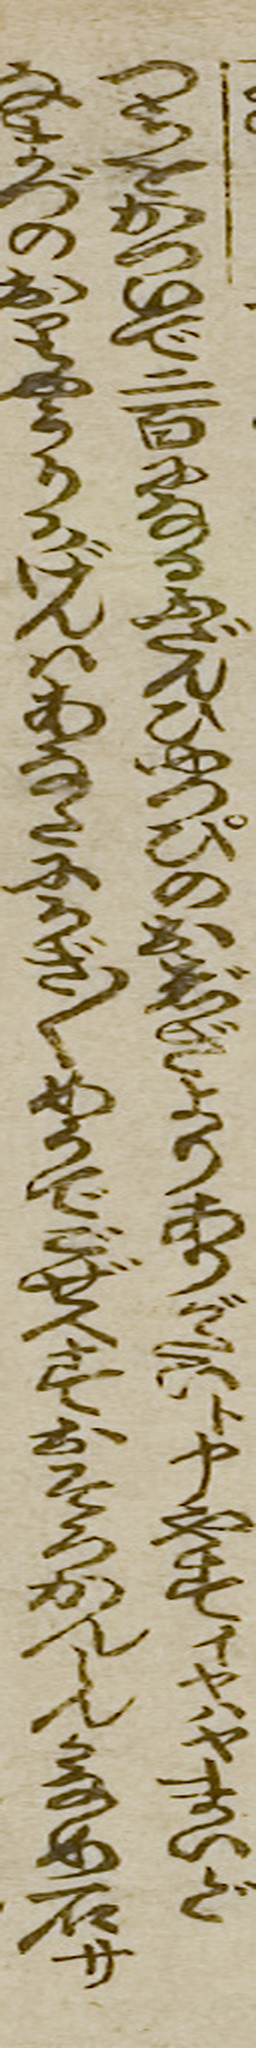なまづのおりやかりかげんハあなたにかぎ〳〵めうでごぜへすおそろかんしんかなめ石サ
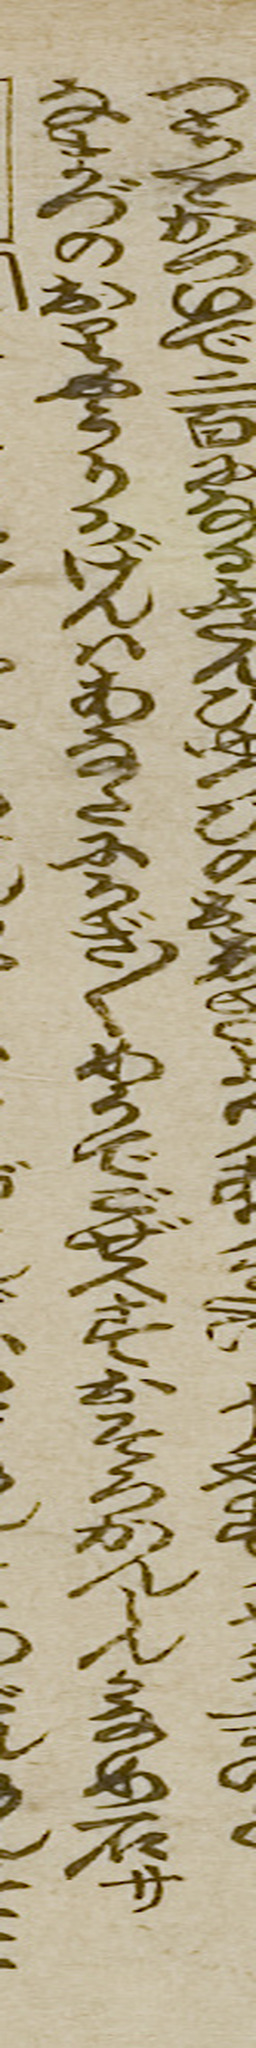なまづのおりやかりかげんハあなたにかぎ〳〵めうでごぜへすおそろかんしんかなめ石サ
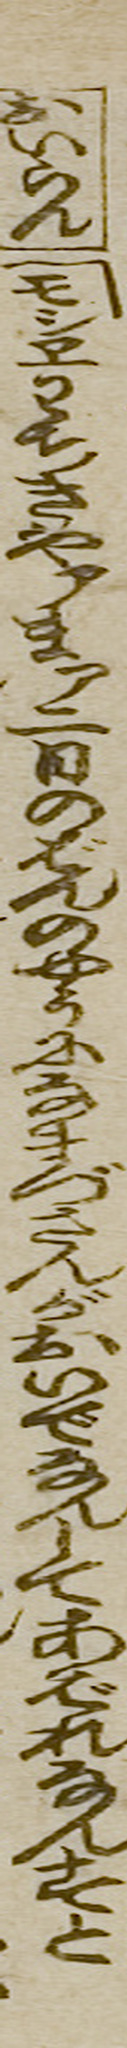おいらん「モシヱわちきヤァまァ二日のばんのやうになまづさんがおいでなんしてあばれなんすと
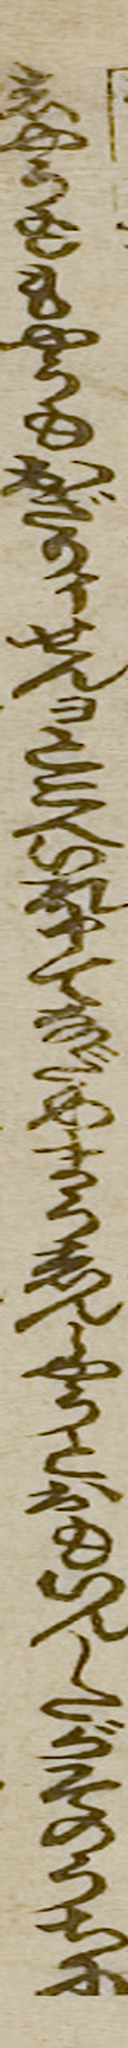しやうももやうもおざりィせんョとこへいれ申してなだめまうしんしやうとおもいんしたがそのうちに
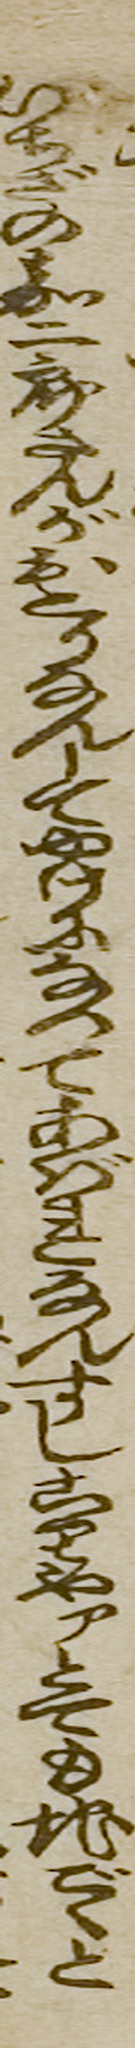いちざの嘉二郎さんがおとりなんしてやけになつてあバれなんすしこりやァとても地ごくと
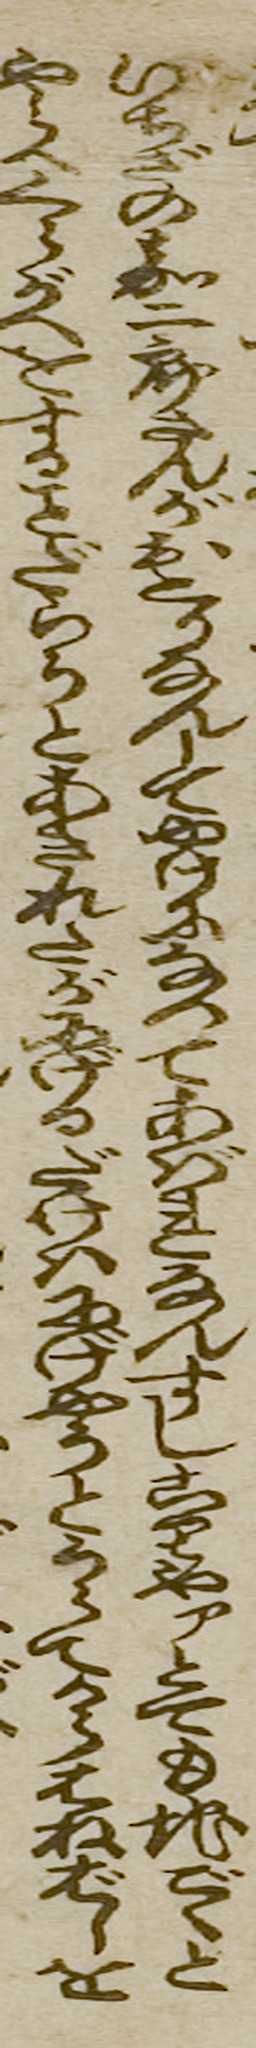やらへくらがへをすることだらうとあきれたがにげるだけハにげやうとうらてからはねばしを
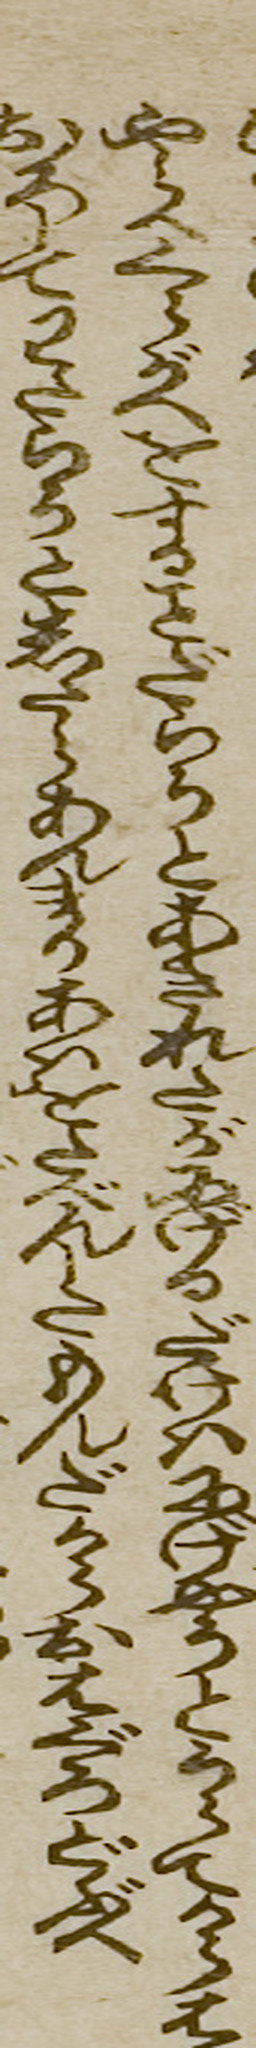おろしてわたらうとしたらあんまりあハをたべんしたもんだからおはぐろどぶへ
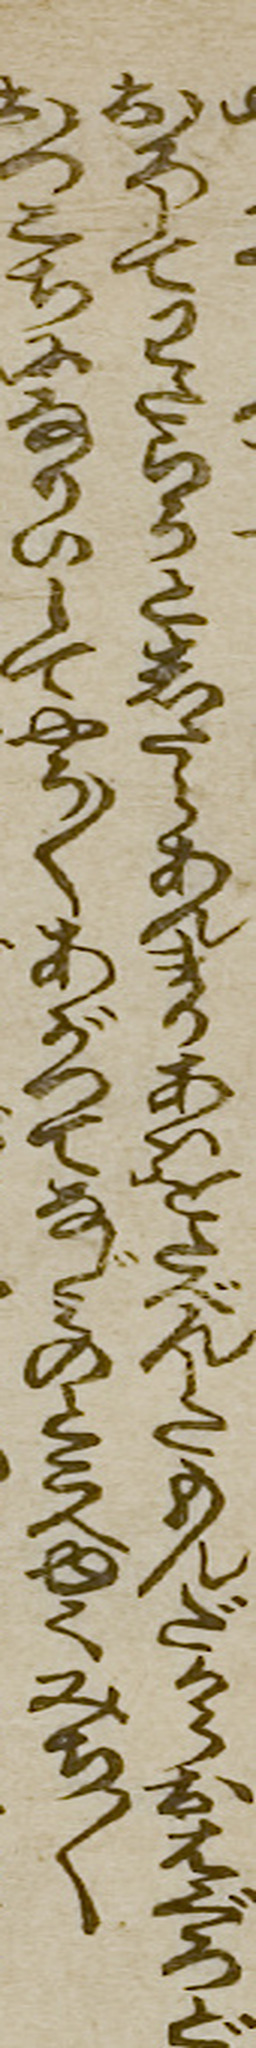おつこちになりいしてやう〳〵あがつてなじミのとこへゆくみち〳〵
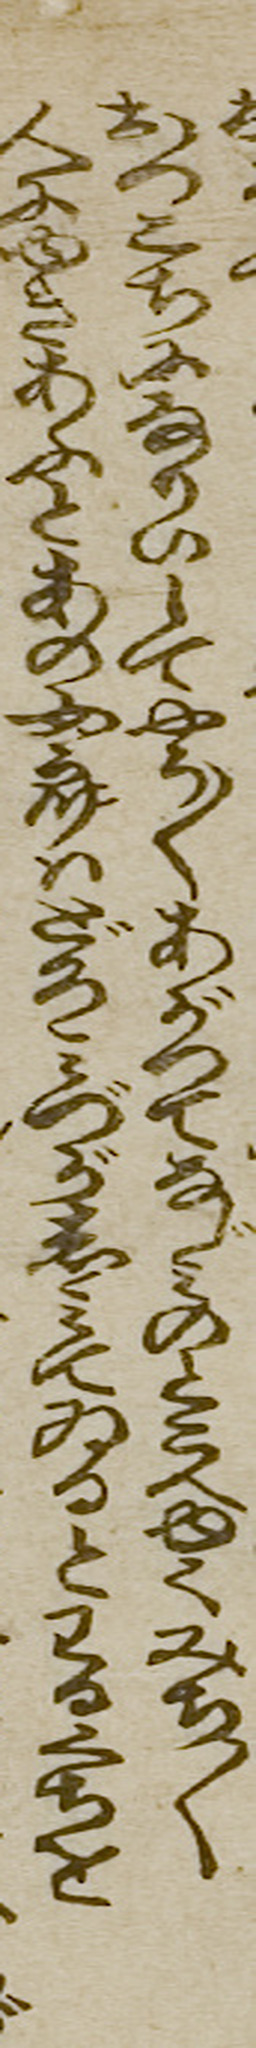人にゆきあふとあの女郎ハどろミづがしみてゐるとわるくちを
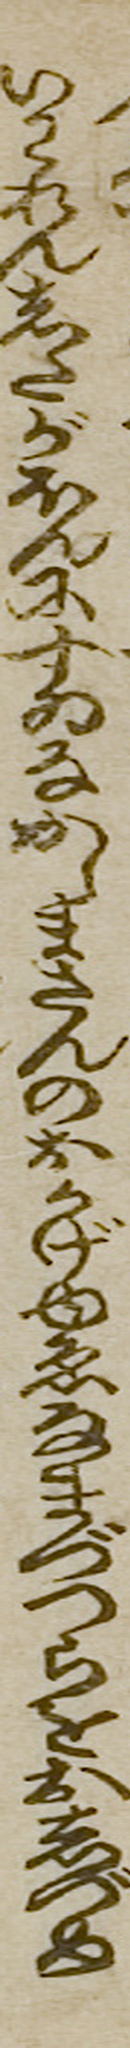いわれんしたがほんにすゐなかしまさんのおかげゆゑなまづつらをおしづめ
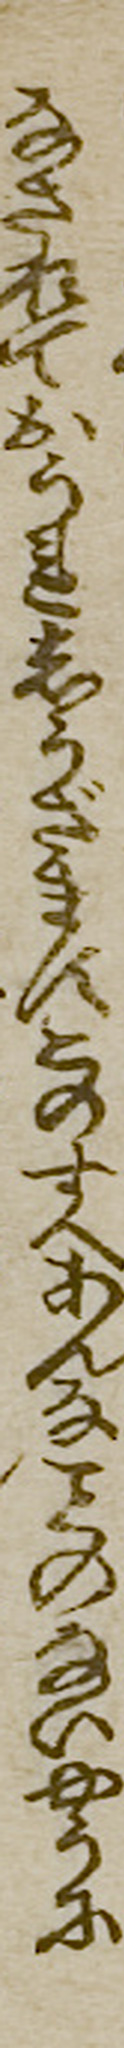なされておかれしうざますこのすへあんなことのないやうに
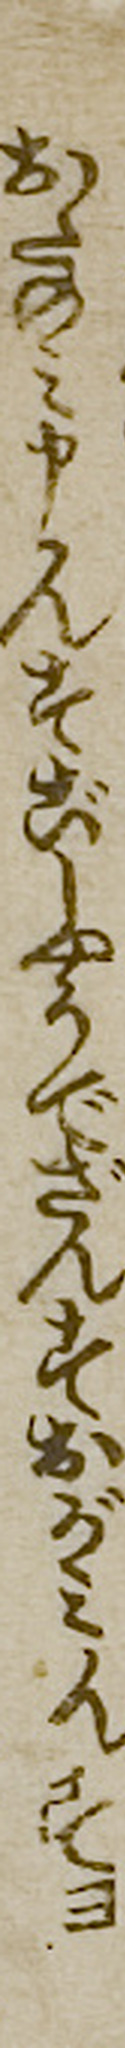おたのミ申しんすごしやうでざんすおがミんすョ
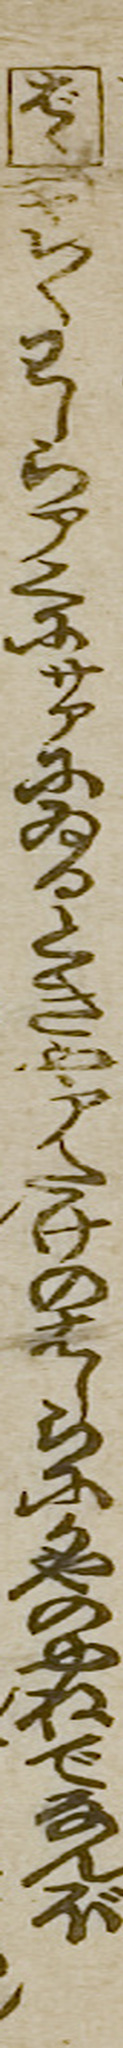ばゝ「ヤレ〳〵わしらァくにサァにゐるときやァたけのはしらにかやのやねでなんぼ
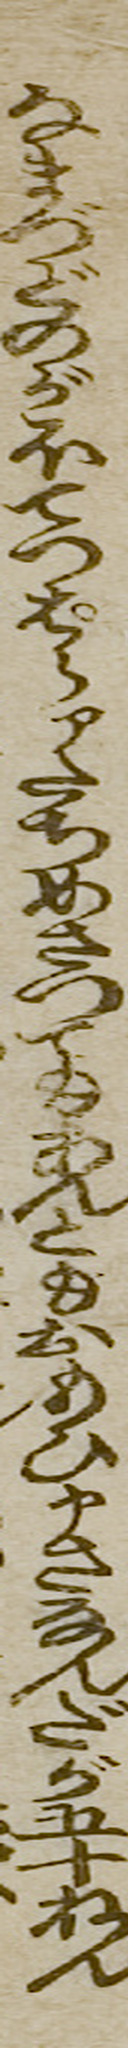なまづどのがほてつぱらァたちめさつてもあんともおもひ申さなんだが五十ねん
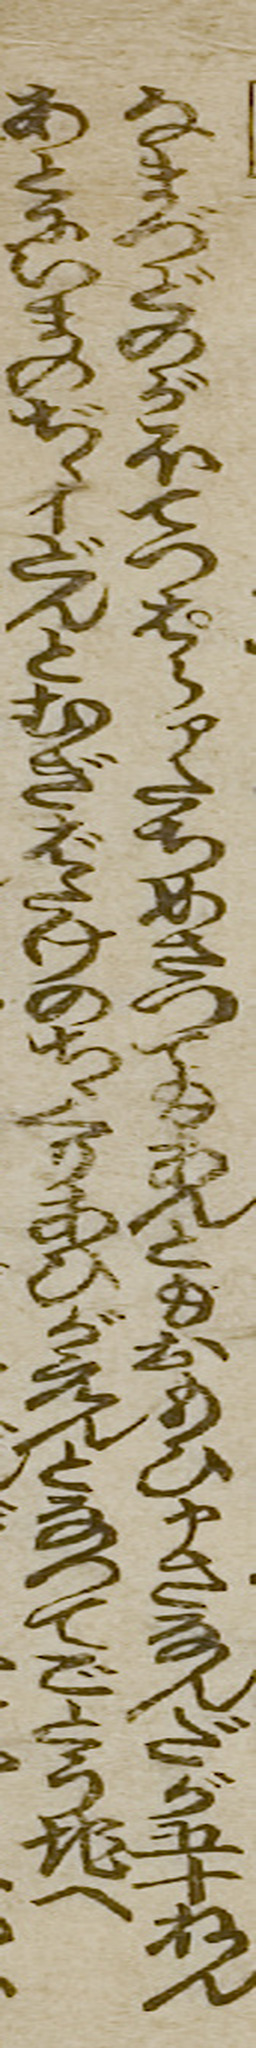あとにいまのぢゝイどんとむぎばたけのちゝくりあひがえんとなつてごとう地へ
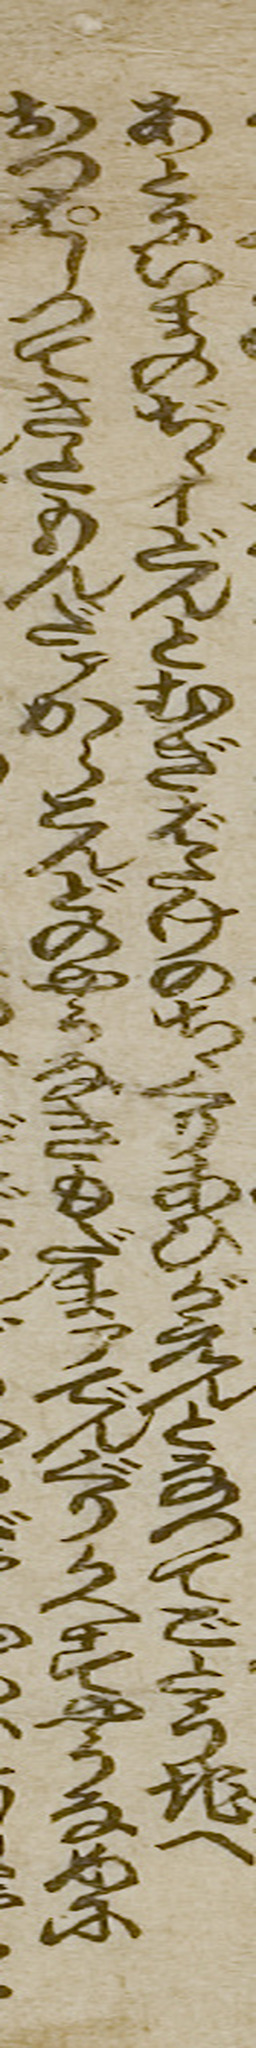おつぱしつてきたもんだァからこんどのやうなきもだまァでんぐりかへすやうなめに
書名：おそろ感心要石
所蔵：東京大学総合図書館 General Library in the University of Tokyo, JAPAN
